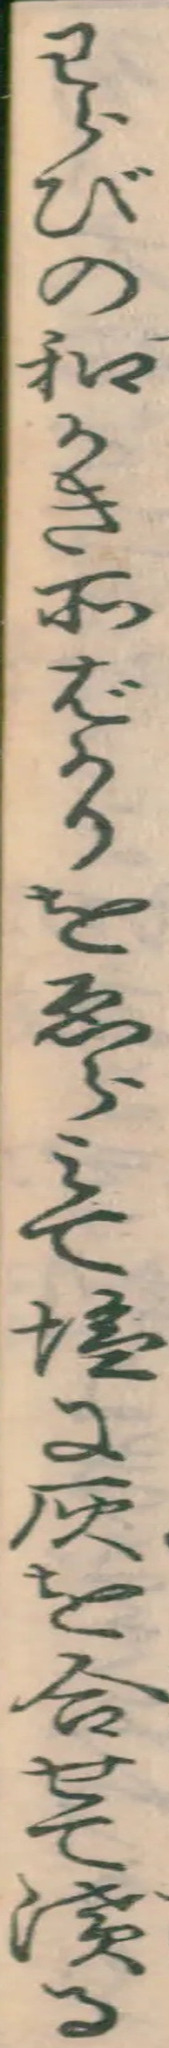わらびの和かき所ばかりをゑらみて塩に灰を合せて漬る
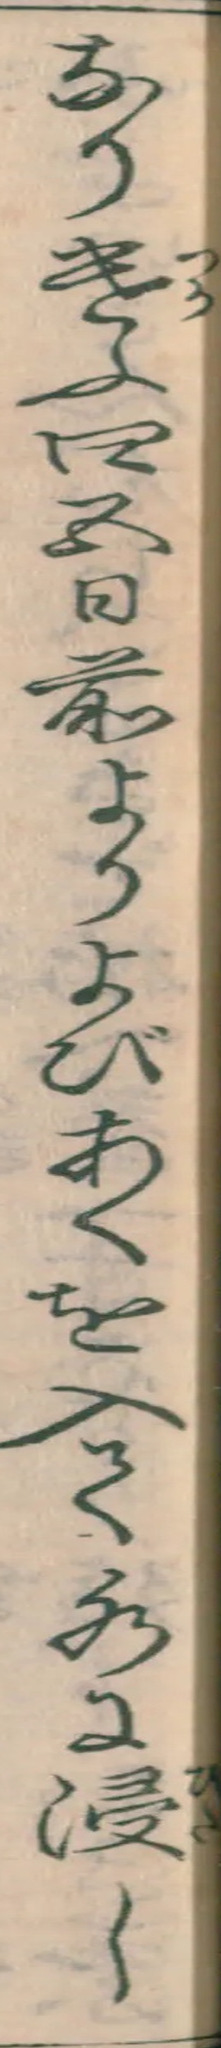なり遣ふ四五日前よりよびあくを入て水に浸し
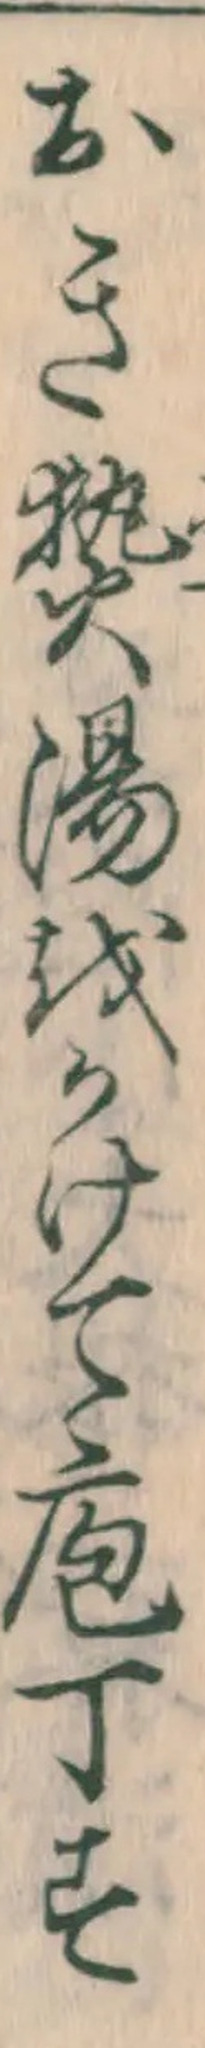おき熱湯をかけて庖丁す
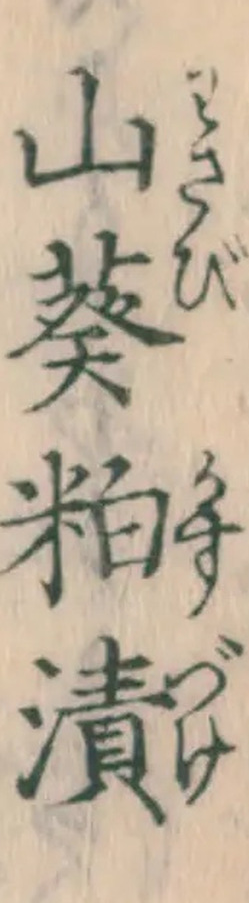山葵粕漬
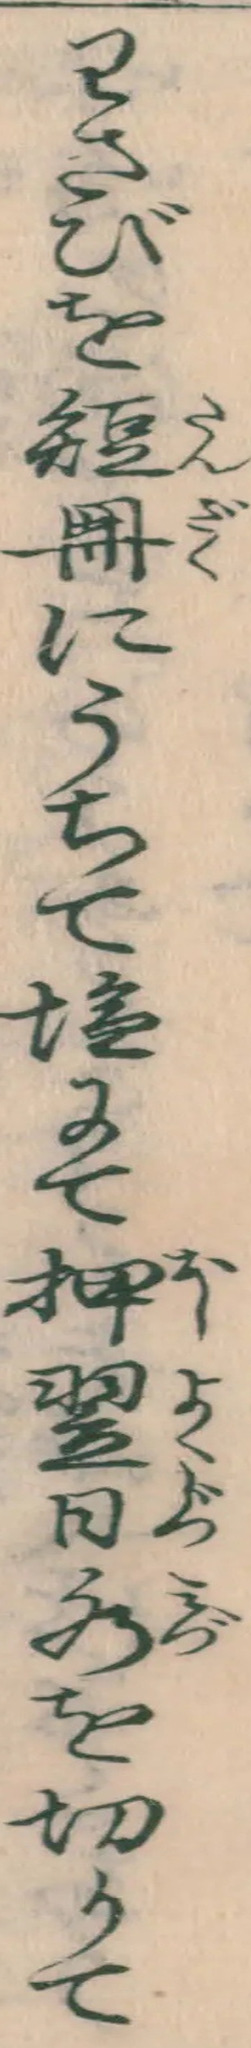わさびを短冊にうちて塩にて押翌日水を切りて
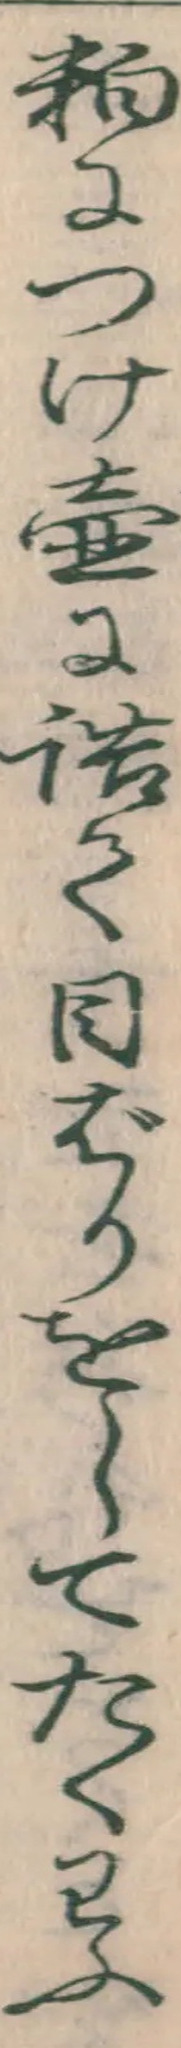粕につけ壺に詰て目ばりをしてたくわふ
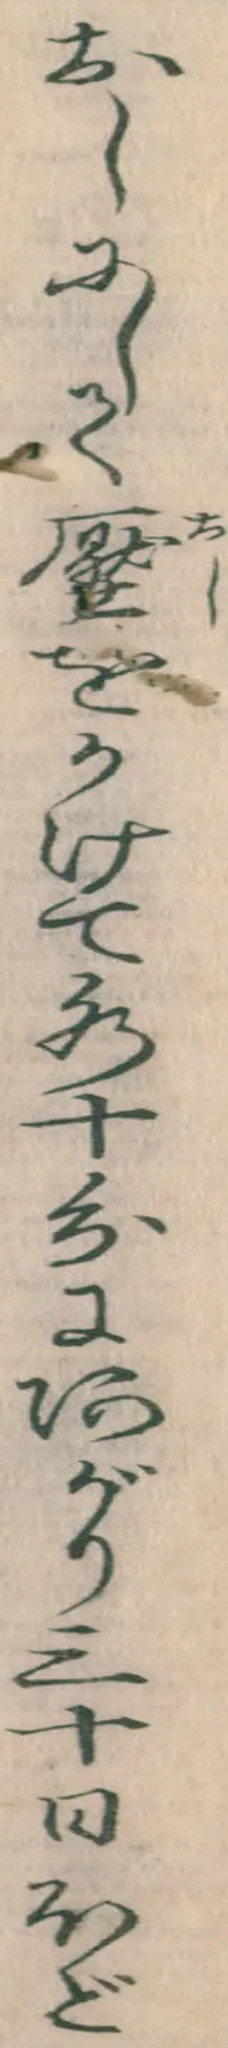おしにして圧をかけて水十分にあがり三十日ほど
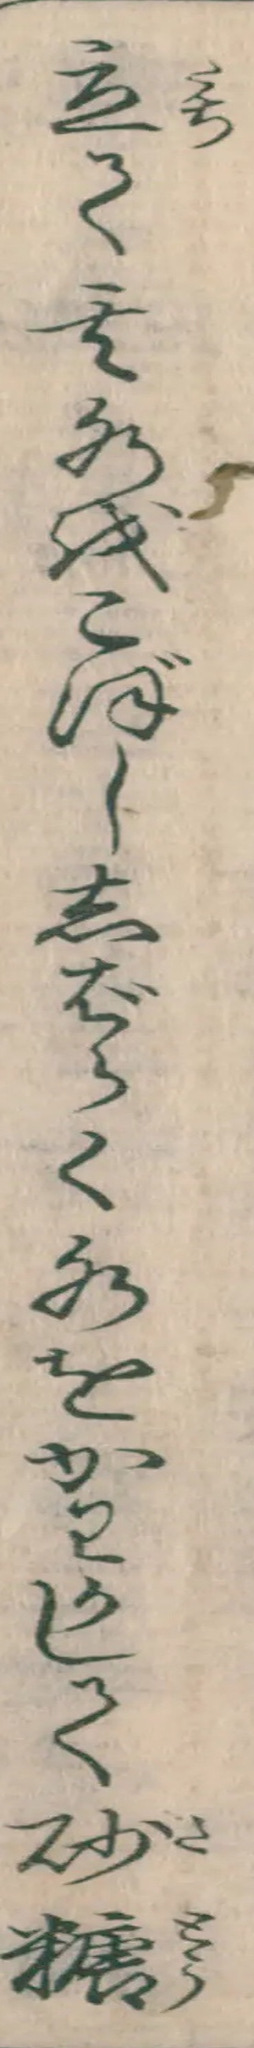立て其水をこぼししばらく水をかわかして砂糖

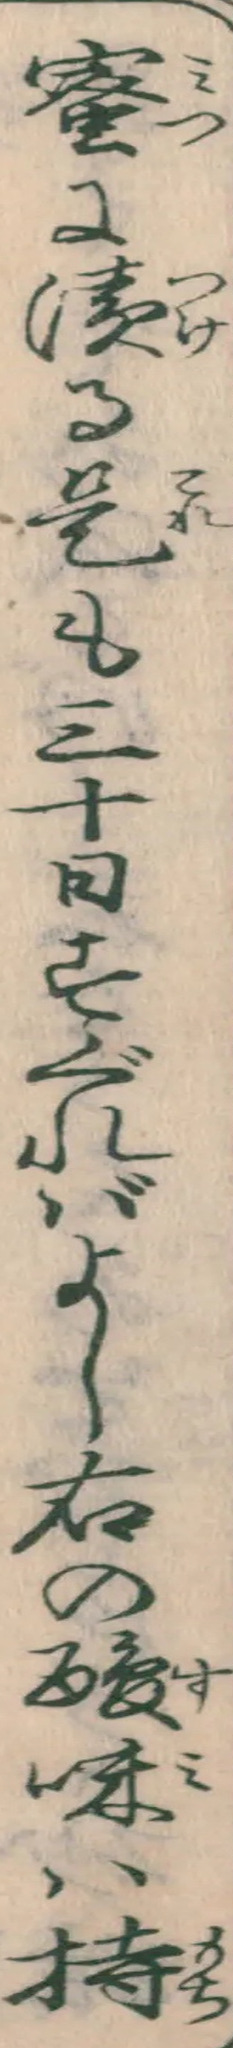蜜に漬る是も三十日すぐればよし右の酸味は持
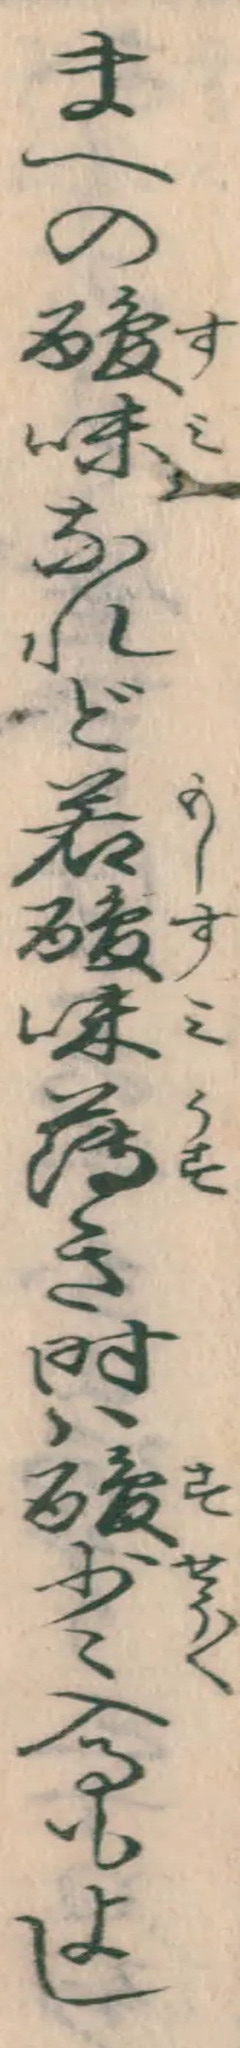まへの酸味なれど若酸味薄き時は酸少々入るもよし
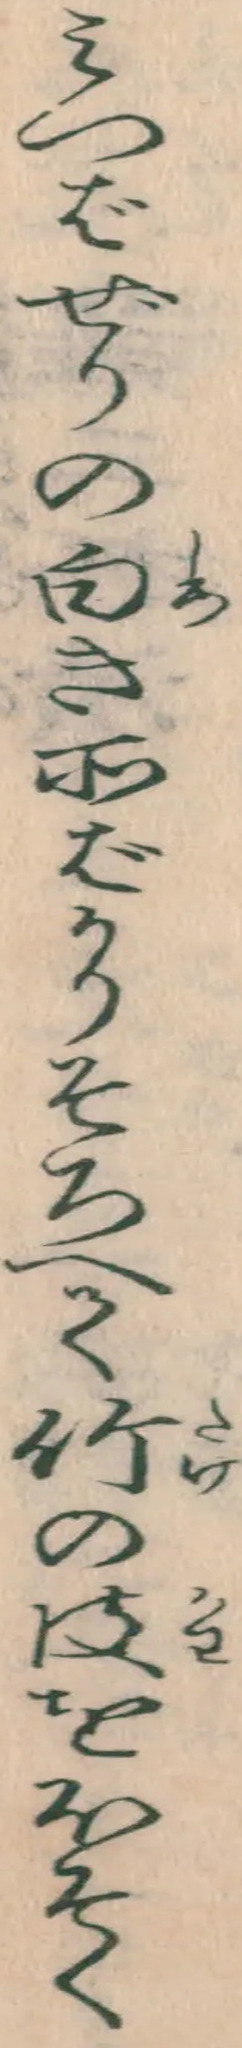みつばぜりの白き所ばかりそろへて竹の皮をほそく
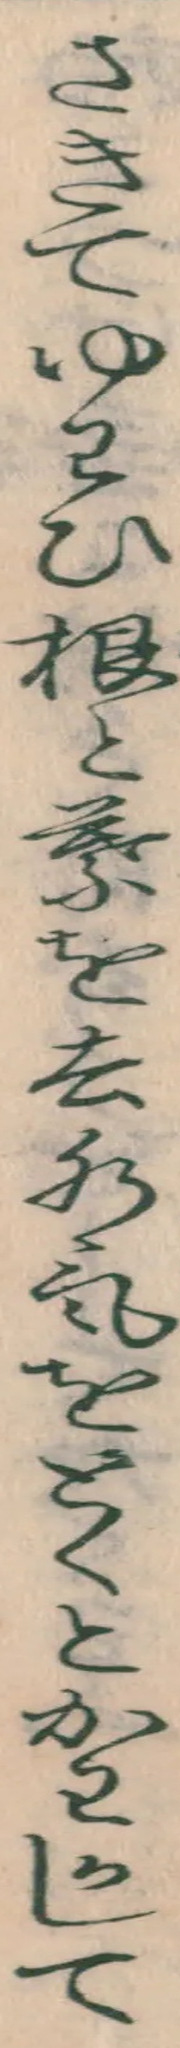さきてゆわひ根と葉を去水気をとくとかわかして
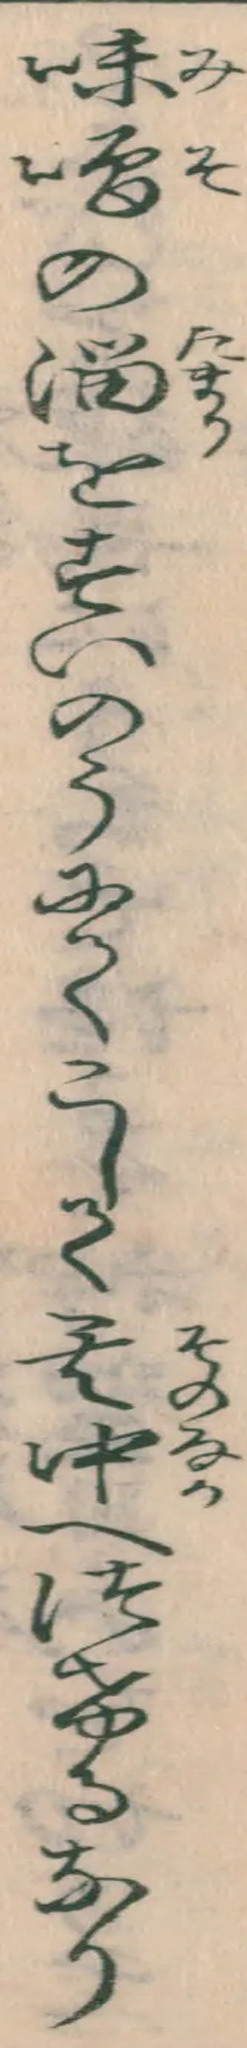味噌の溜をすいのうにてこして其中へつけるなり
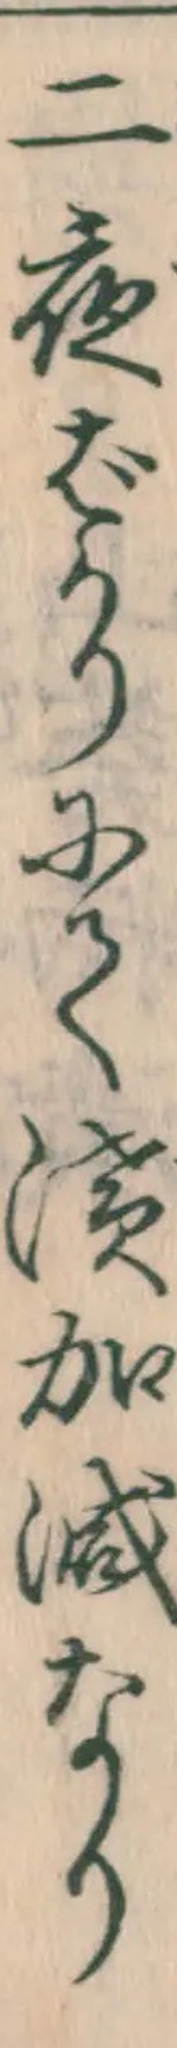二夜ばかりにて漬加減なり
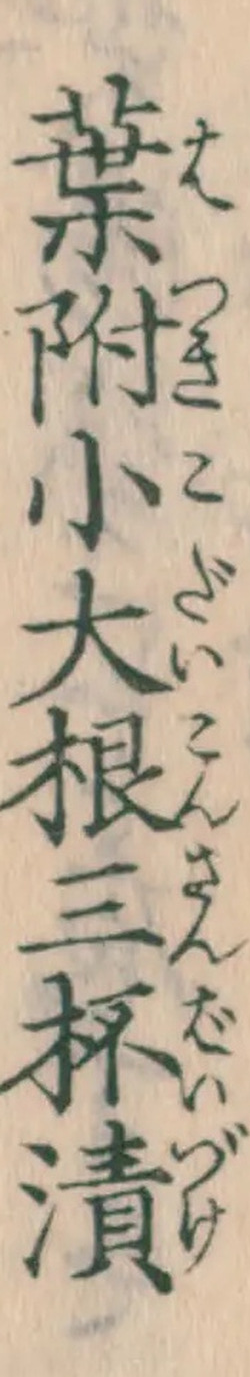葉附小大根三杯漬
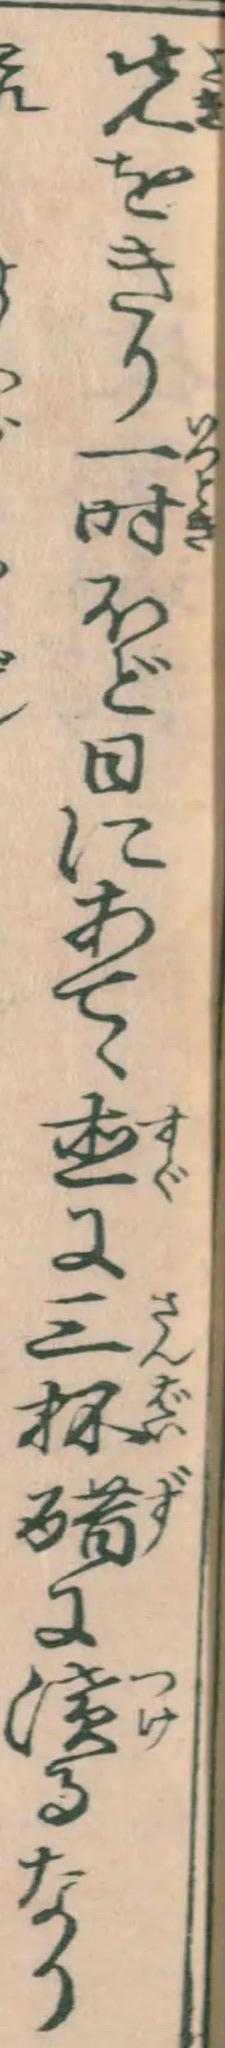先をきり一時ほど日にあてゝ直に三杯醋に漬るなり
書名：四季漬物鹽嘉言
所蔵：国立国会図書館 National Diet Library, JAPAN
